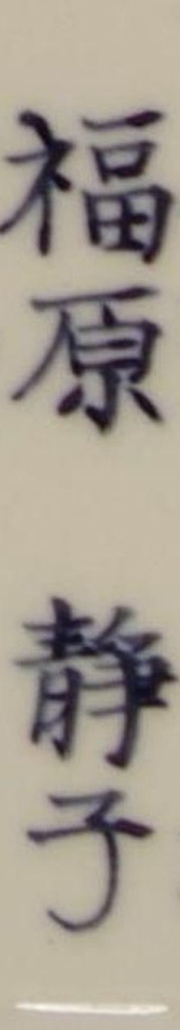福原静子
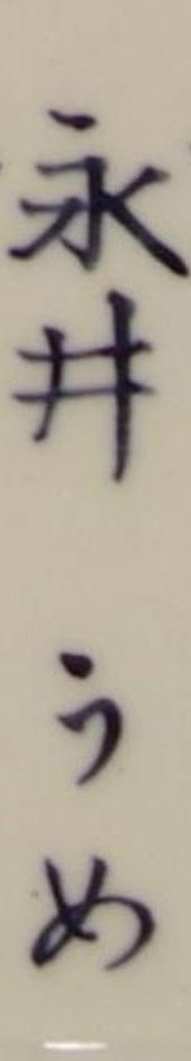永井うめ
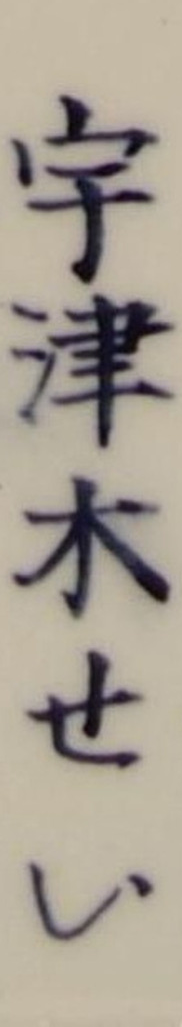宇津木せい
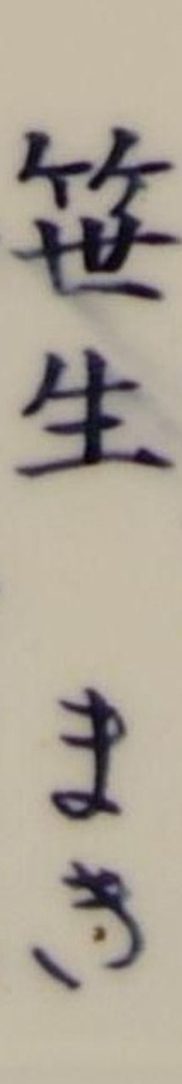笹生まき
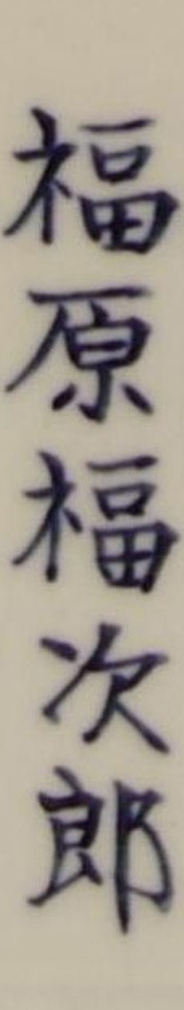福原福次郎
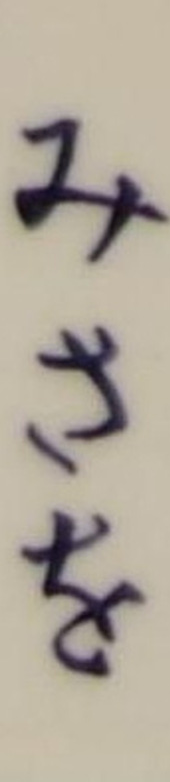みさを
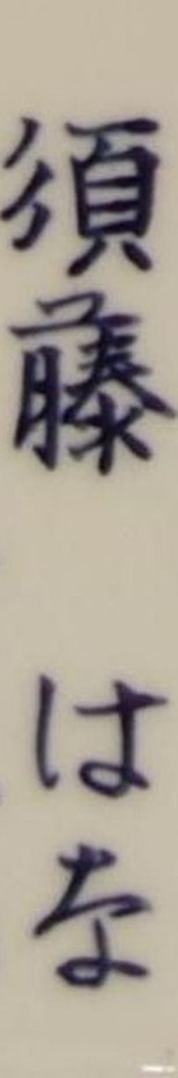須藤はな
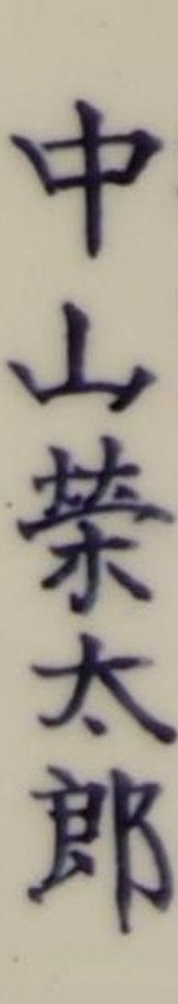中山榮太郎
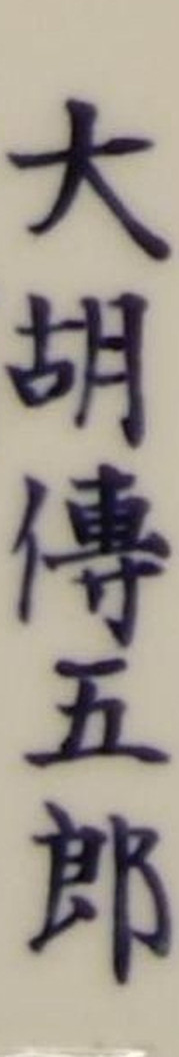大胡傳五郎
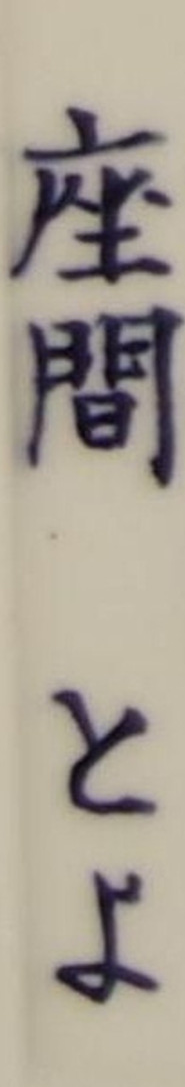座間とよ

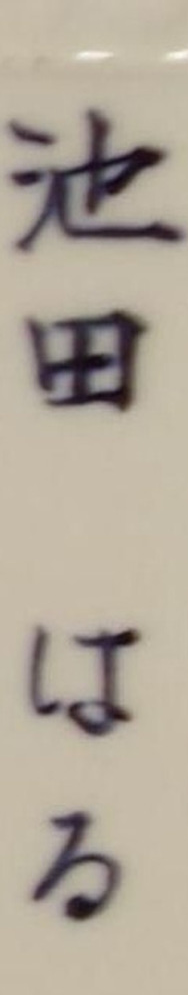池田はる
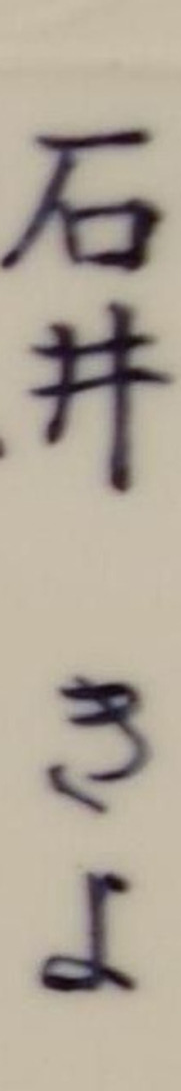石井きよ
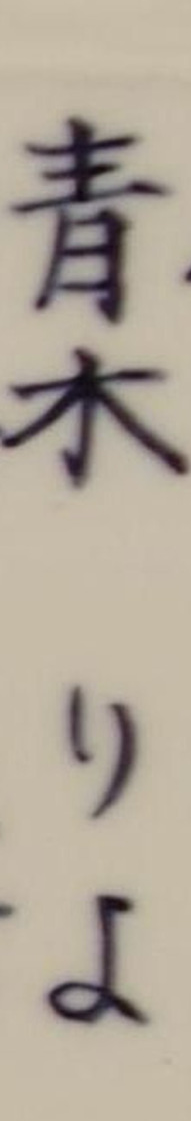青木りよ
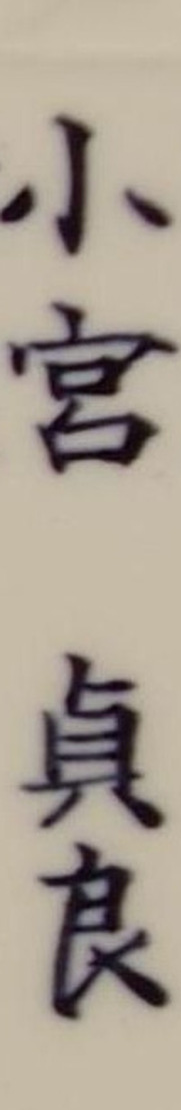小宮貞良
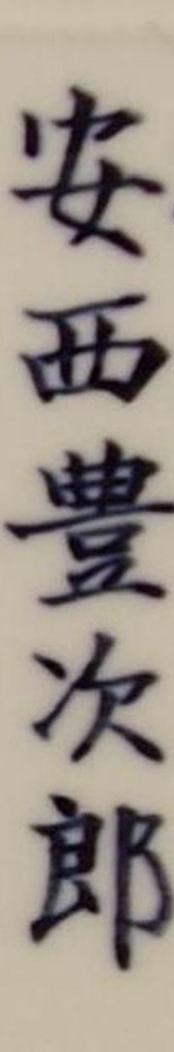安西豊次郎
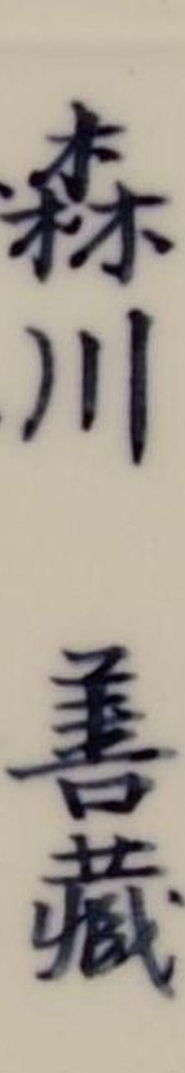森川善蔵
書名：E~L
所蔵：高野山金剛峯寺
